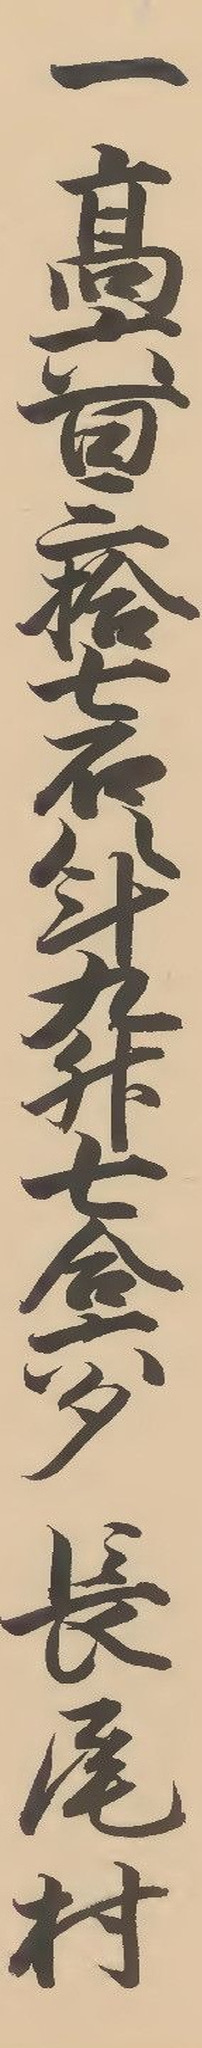一髙六百三拾七石八斗九升七合六夕長尾村
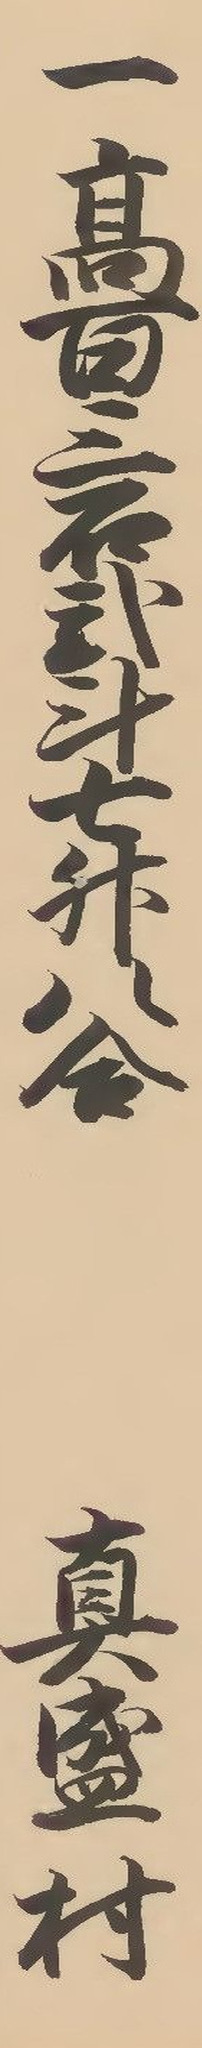一髙百三石弐斗七升八合真盛村
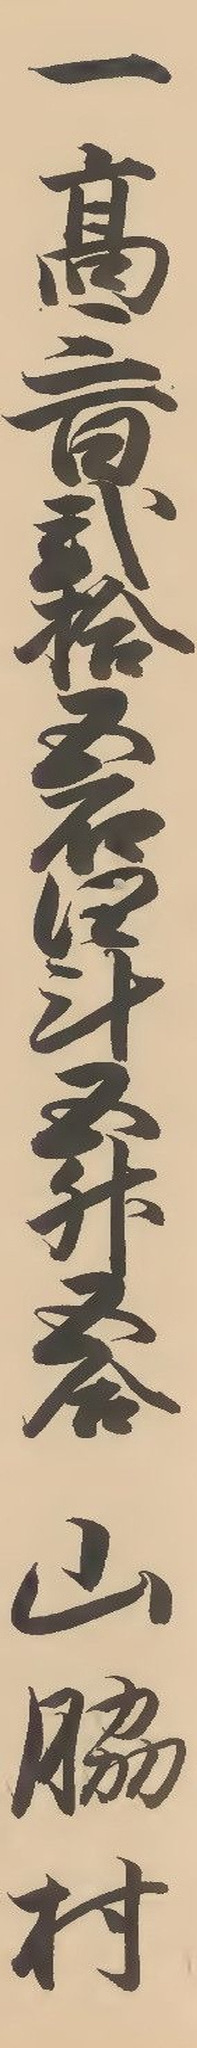一髙三百弐拾五石四斗五升五合山脇村
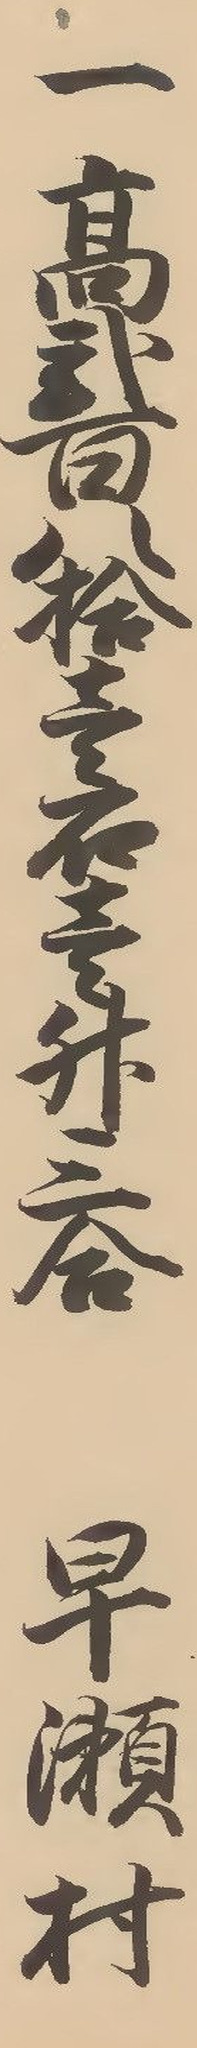一髙弐百八拾壱石壱升三合早瀬村
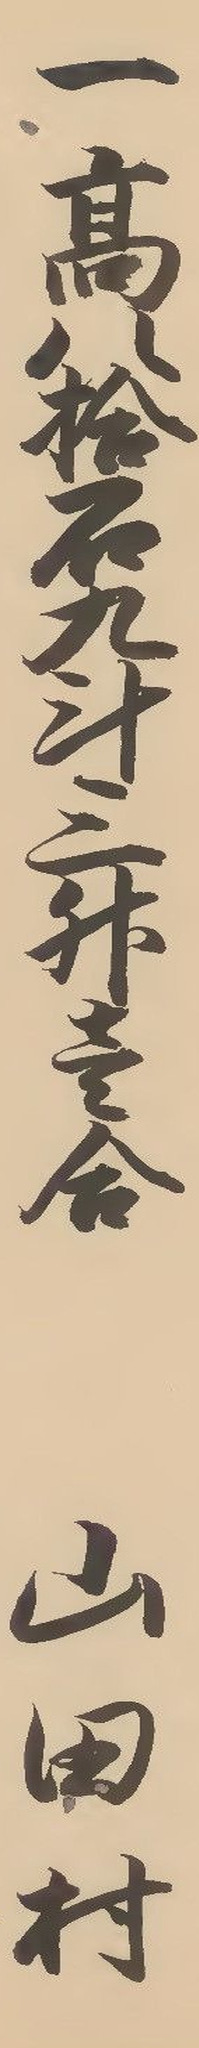一髙八拾石九斗三升壱合山田村
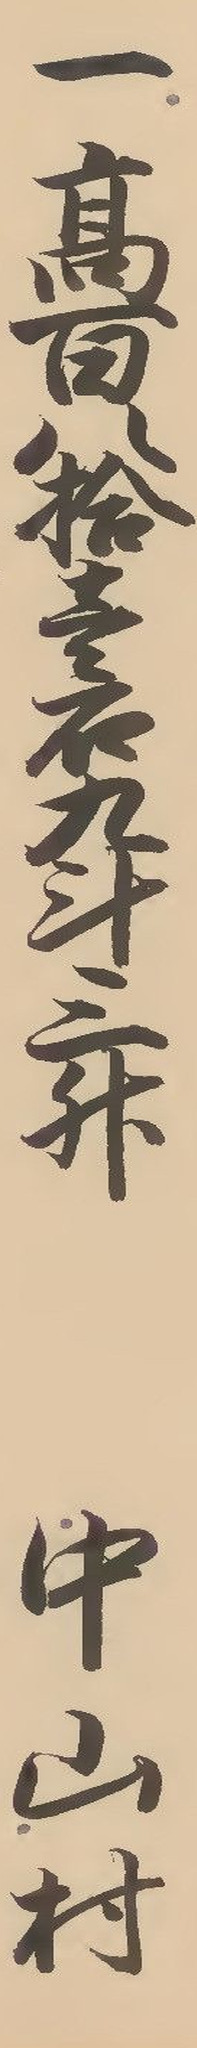一髙百八拾壱石九斗三升中山村

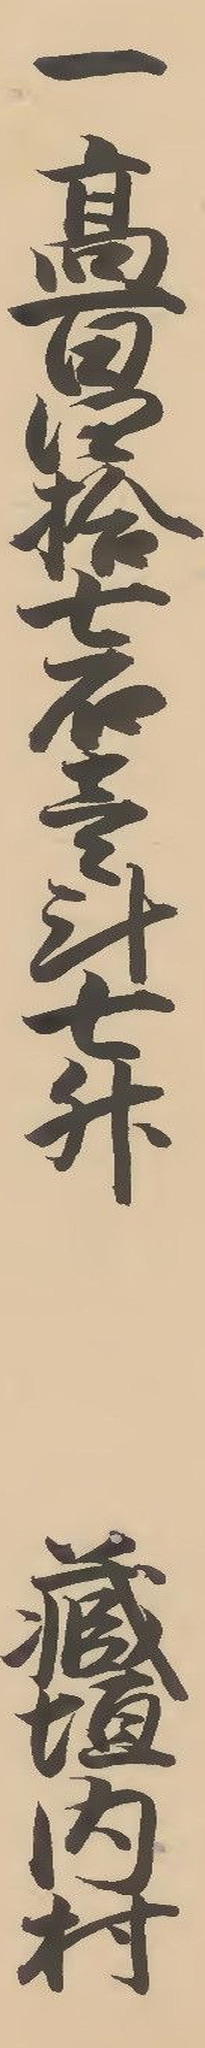一髙百四拾七石壱斗七升藏垣内村
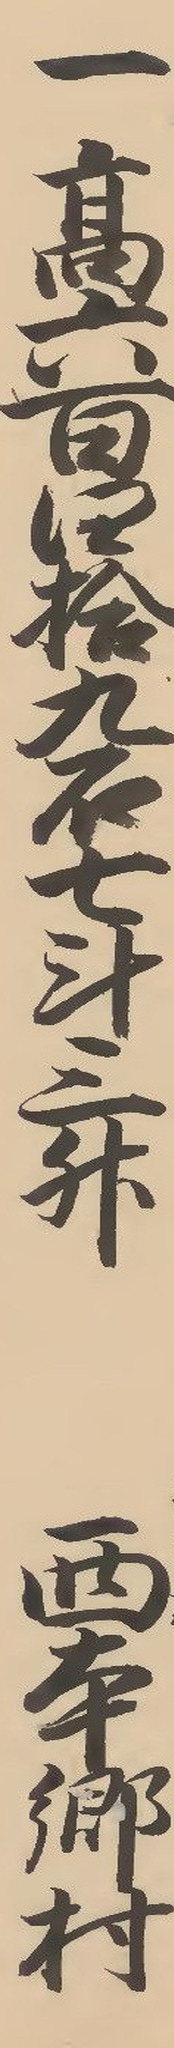一髙六百四拾九石七斗三升西本郷村
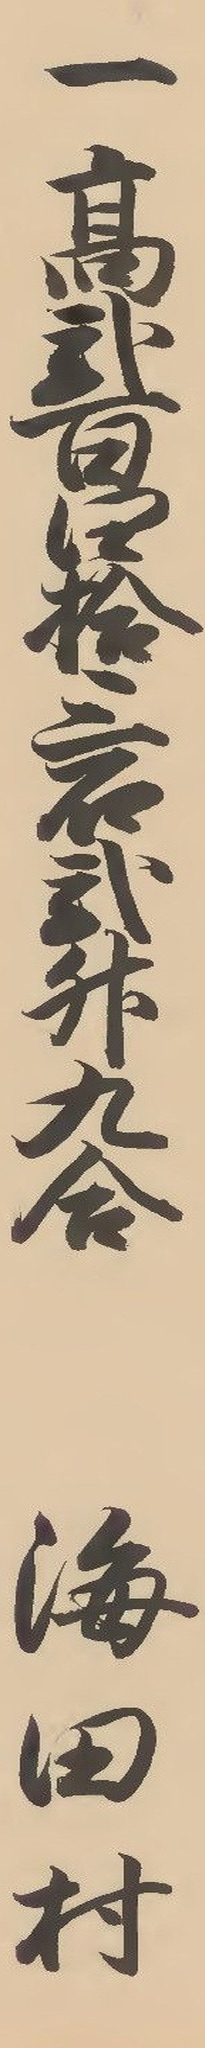一髙弐百四拾三石弐升九合海田村
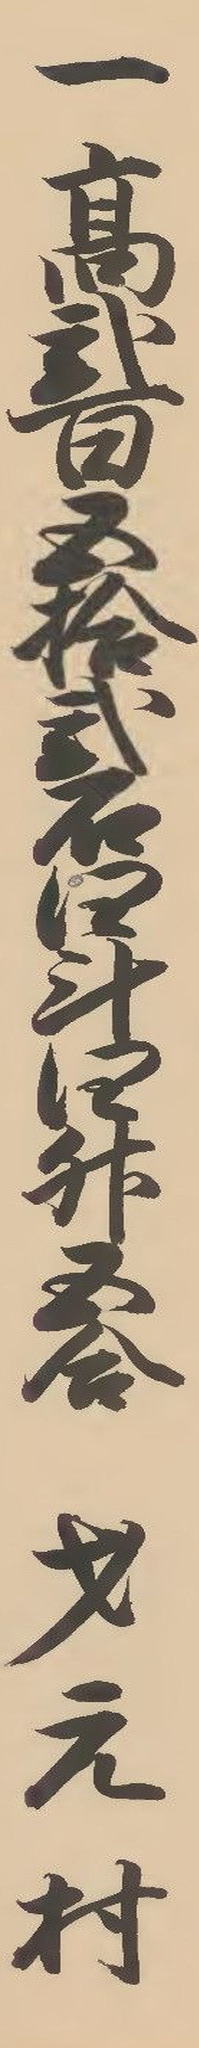一髙弐百五拾弐石四斗四升五合才元村
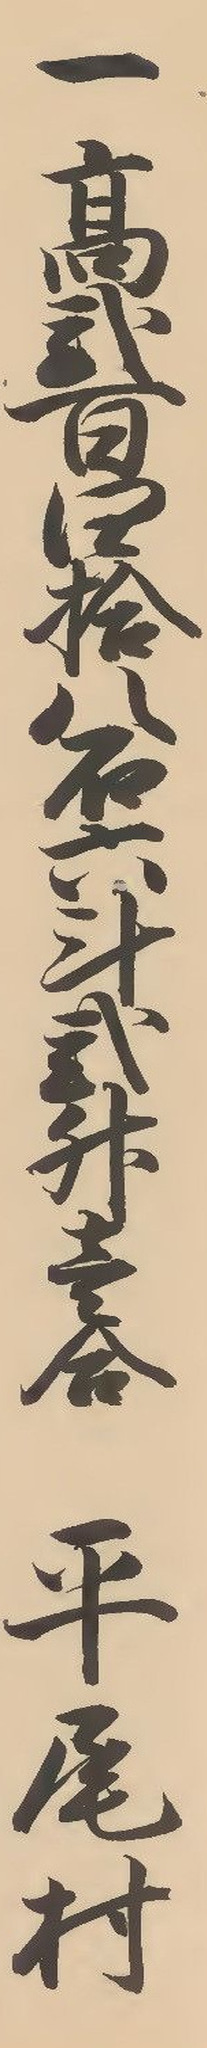一髙弐百四拾八石六斗弐升壱合平尾村
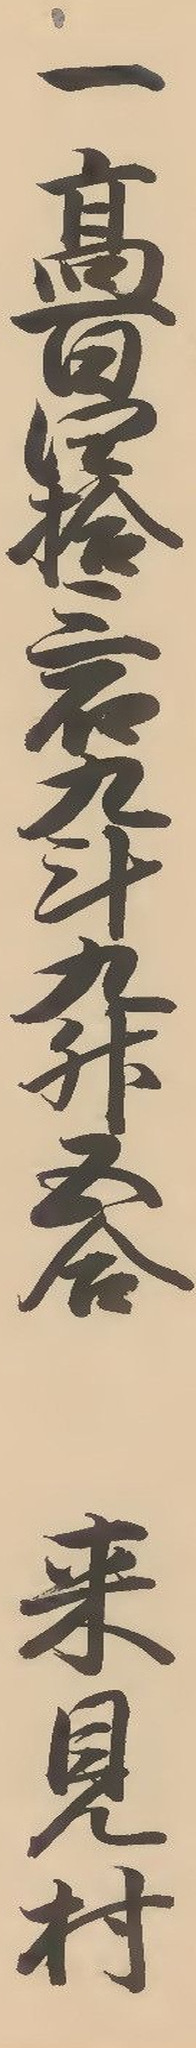一髙百四拾三石九斗九升五合来見村
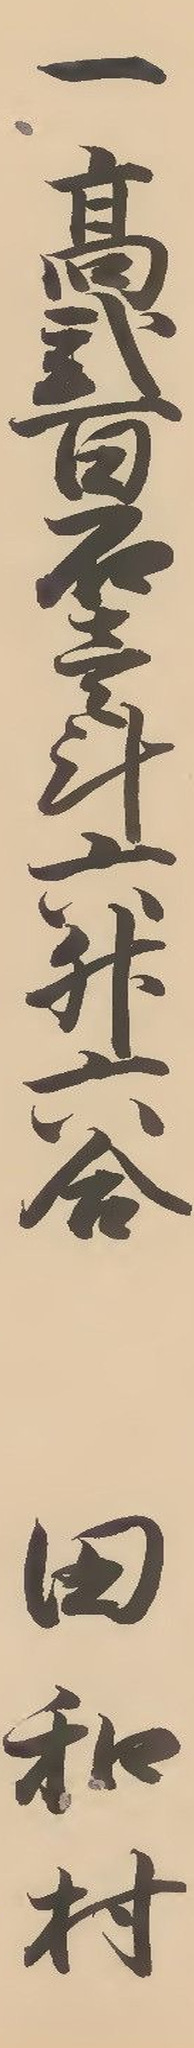一髙弐百石壱斗六升六合田和村
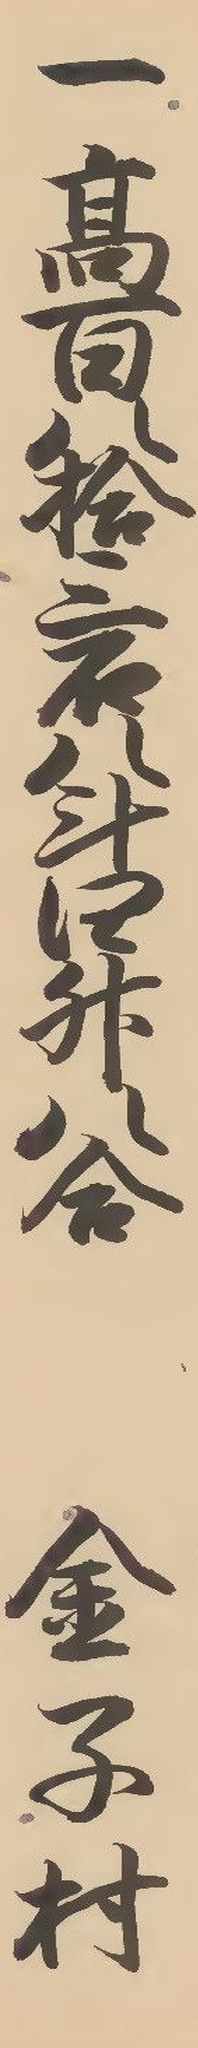一髙百八拾三石八斗四升八合金子村

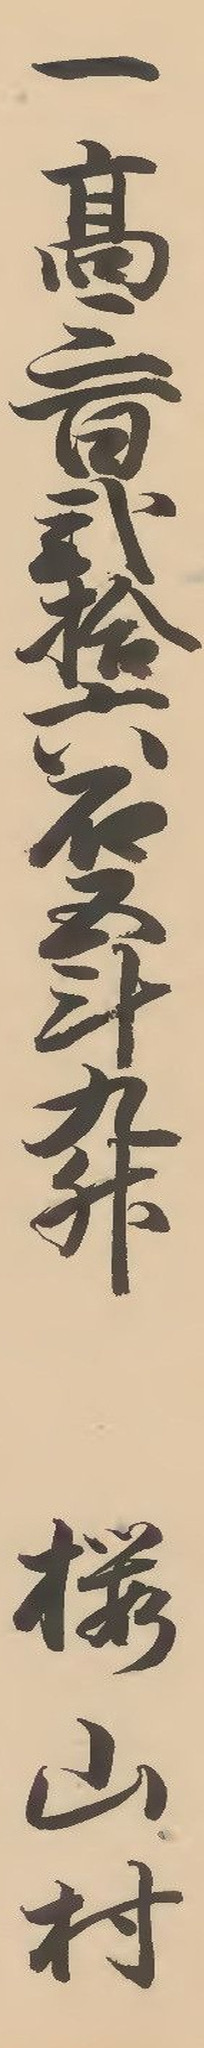一髙三百弐拾六石五斗九升櫻山村
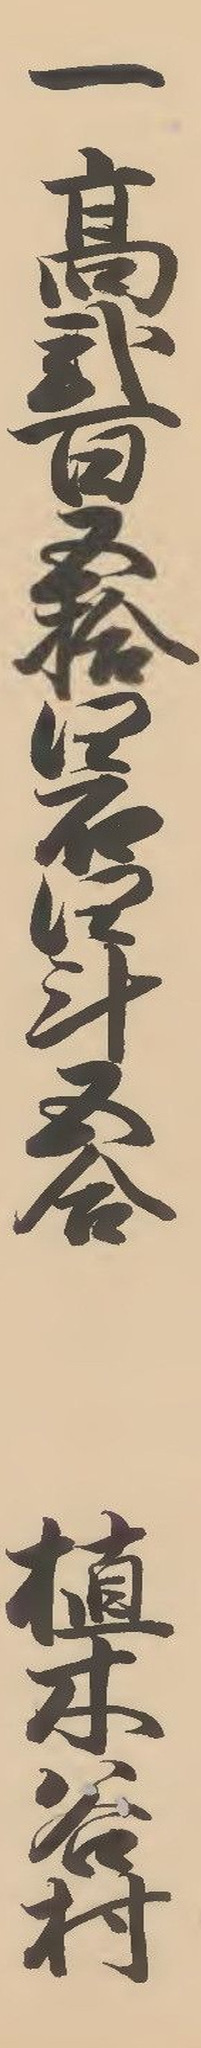一髙弐百五拾四石四斗五合植木谷村
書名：播磨国郷帳
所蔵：国立公文書館 National Archives of Japan
